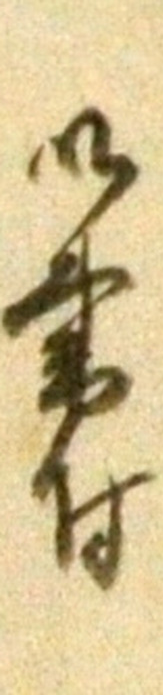以書付
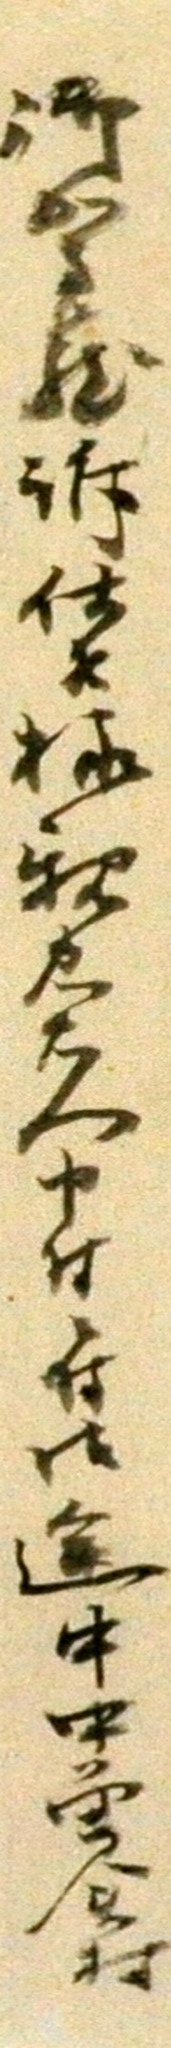御駕籠訴仕候様親忠右衛門申付ニ付御途中中曾倉村
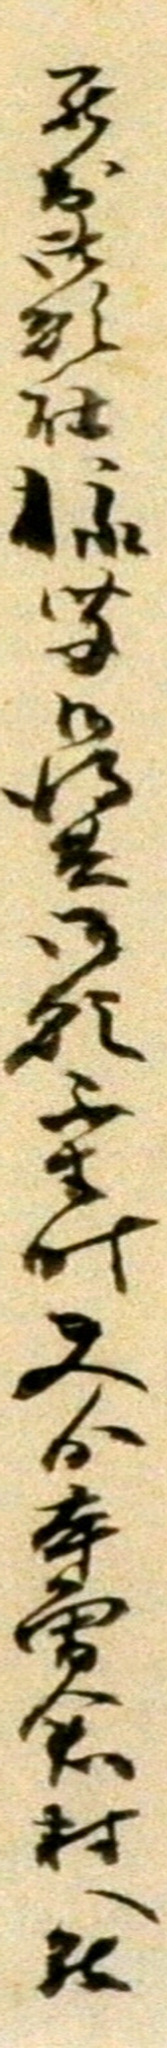罷出御願仕様聞候得共御願不相叶夫ゟ本曾倉村へ罷
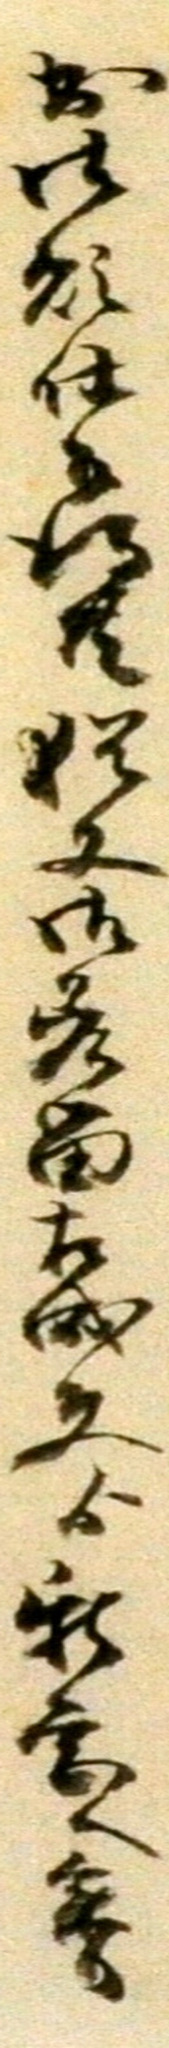出御願仕候得共猶又御差留相成夫ゟ新宮へ参り
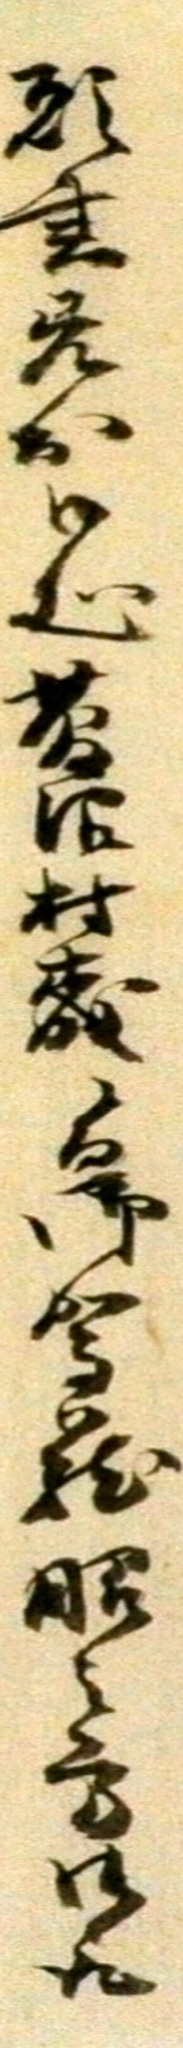願書差出同所菅沼村森ニ而御駕籠脇之方御取
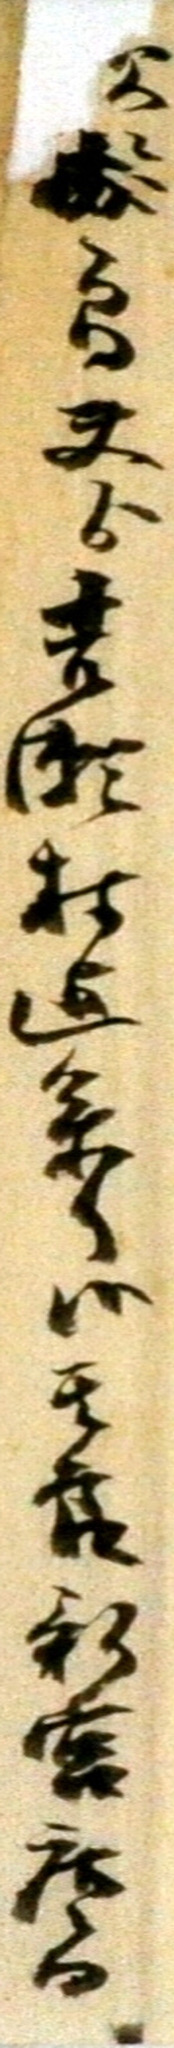写し成候間夫ゟ吉瀬村迄参り候其節新宮社二而
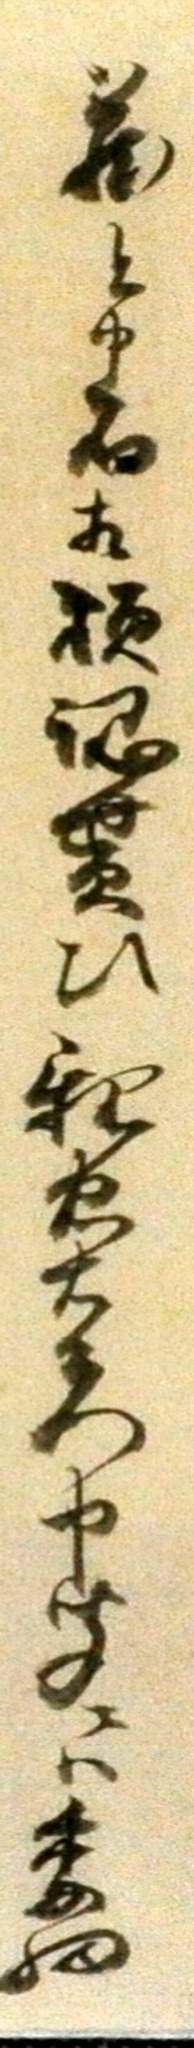義と申而相頼認め貰ひ親忠右衛門申聞ニハ委細
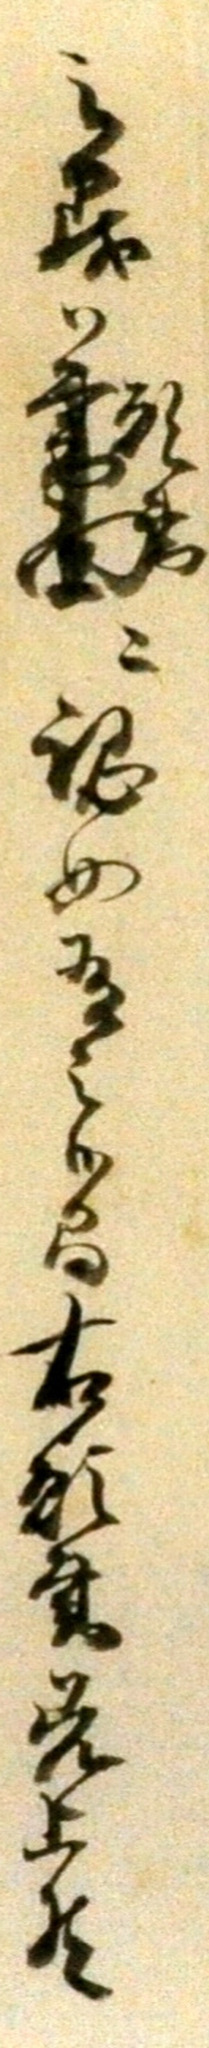高森御願書ニ認め有之候間右願書差上候
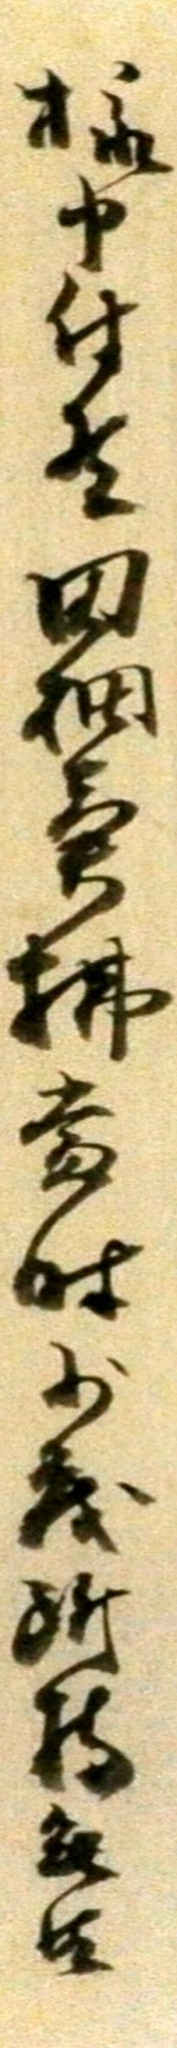様申付候田畑売払当時少茂所持無御
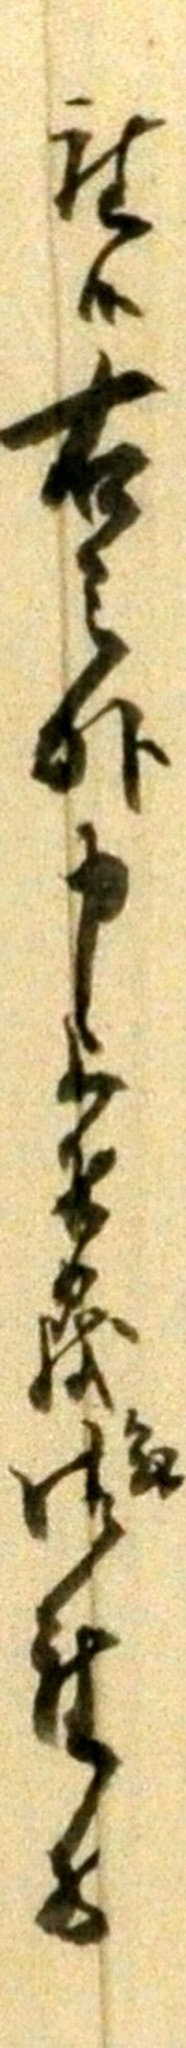座候右之外申上候義無御座候
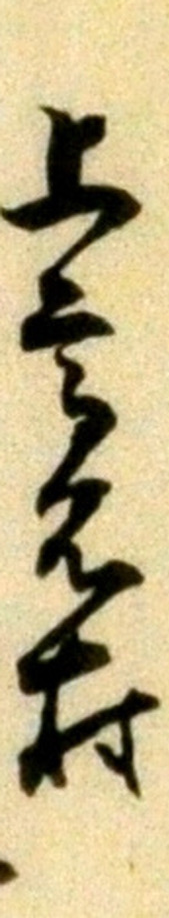上高見村
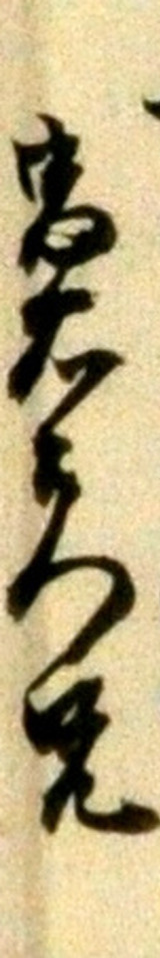忠右衛門兄
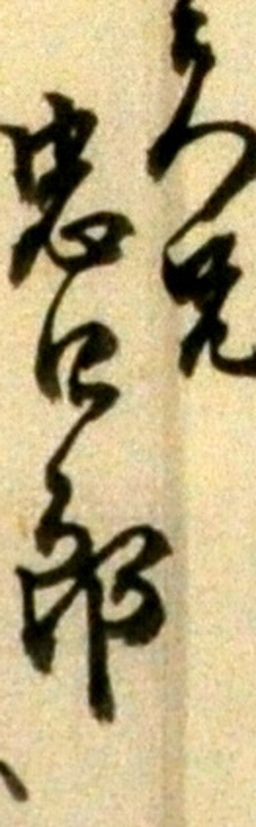忠四郎
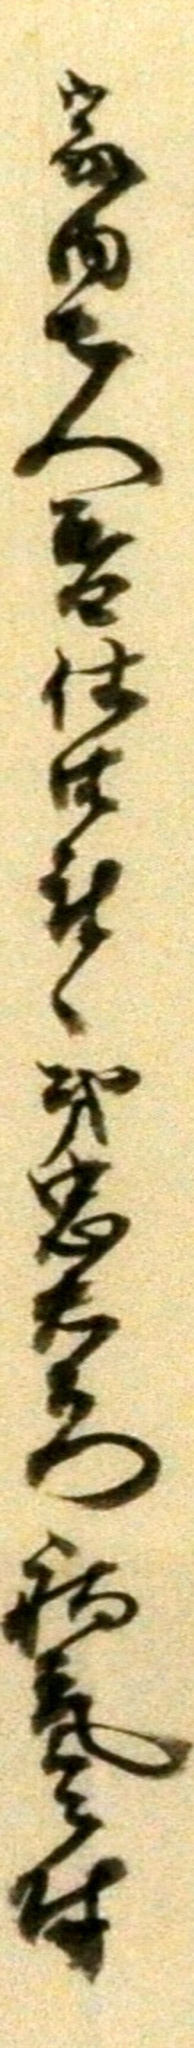家内七人暮仕御座候弟忠右衛門病気ニ付
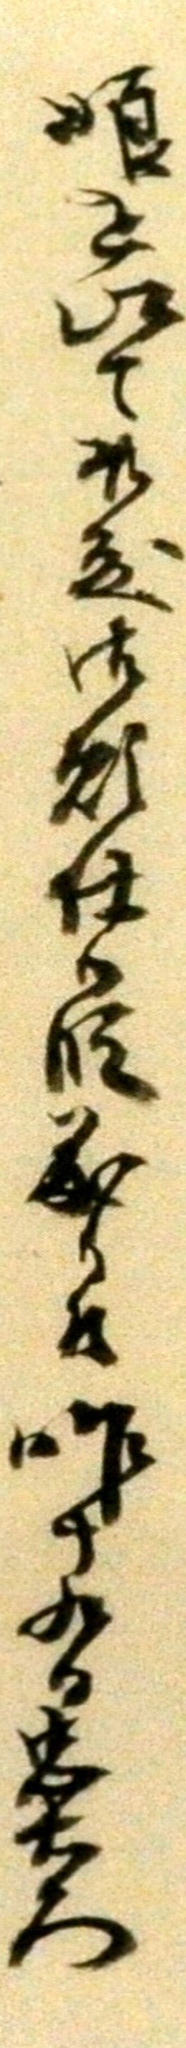娘を以此度御願仕候段承り候昨十九日忠右衛門
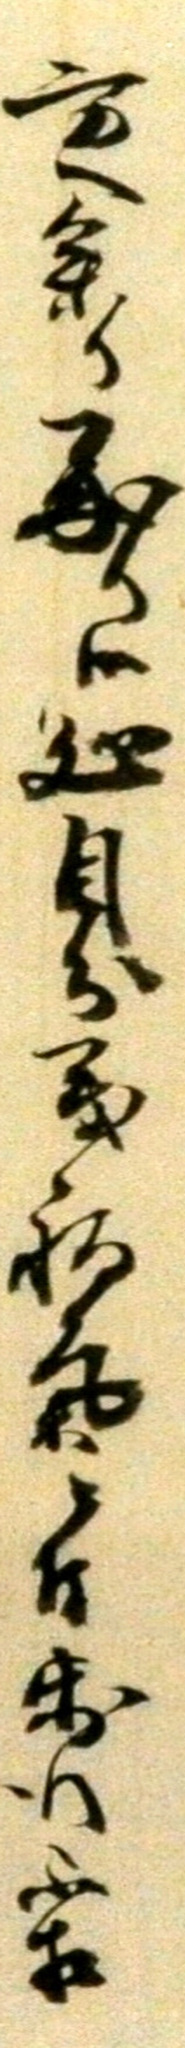方へ参り承り候自分義病気ニ付歩行不相
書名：中沢村駕籠訴事件書類写
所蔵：伊那市立高遠町図書館・合同会社AMANE
